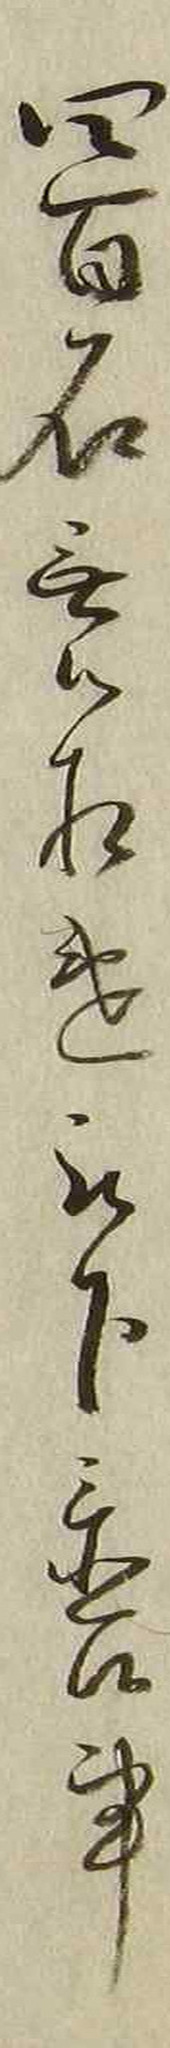四百石無御相違遣被下置候事
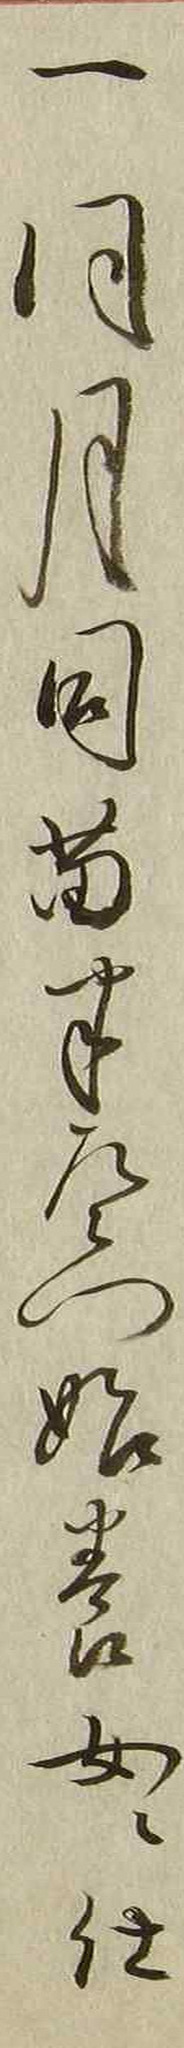一同月同苗半左衛門娘養女ニ仕
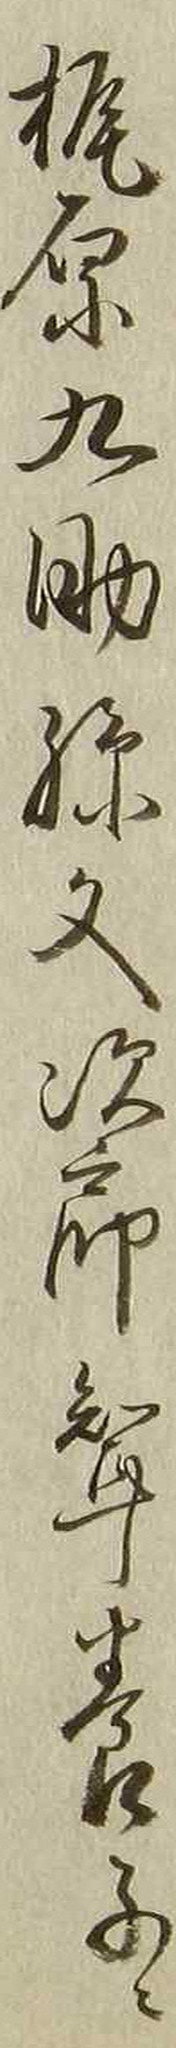梶原九助孫又次郎聟養子ニ
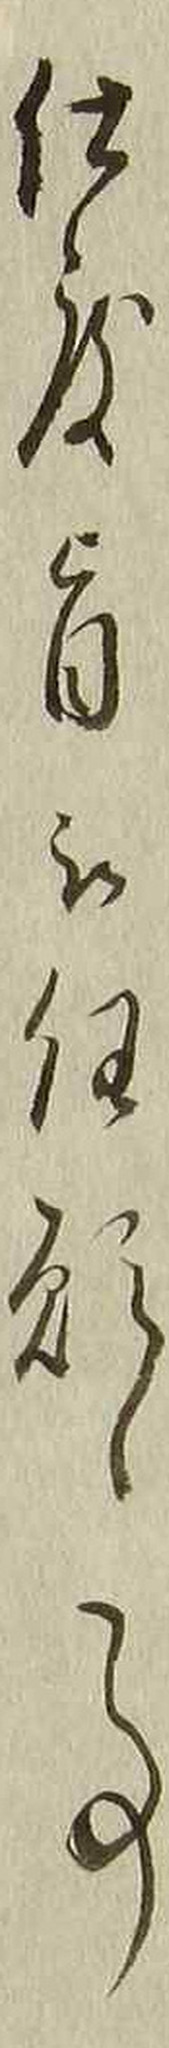仕度旨被任願候事
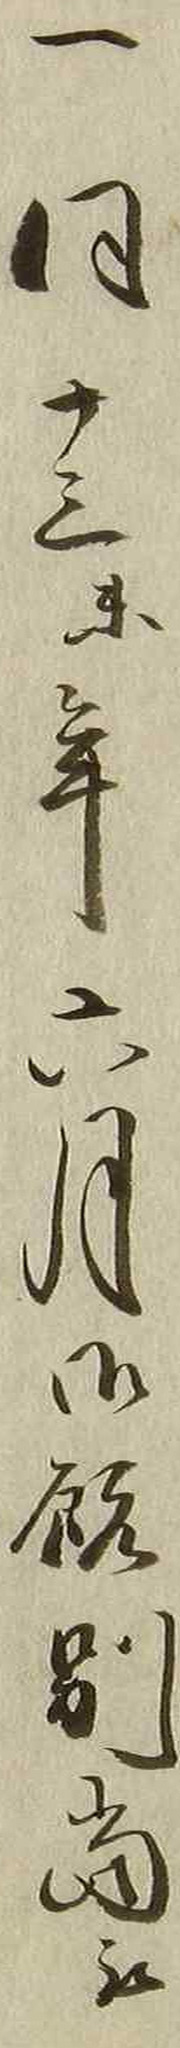一同十三未年六月御厩別当被
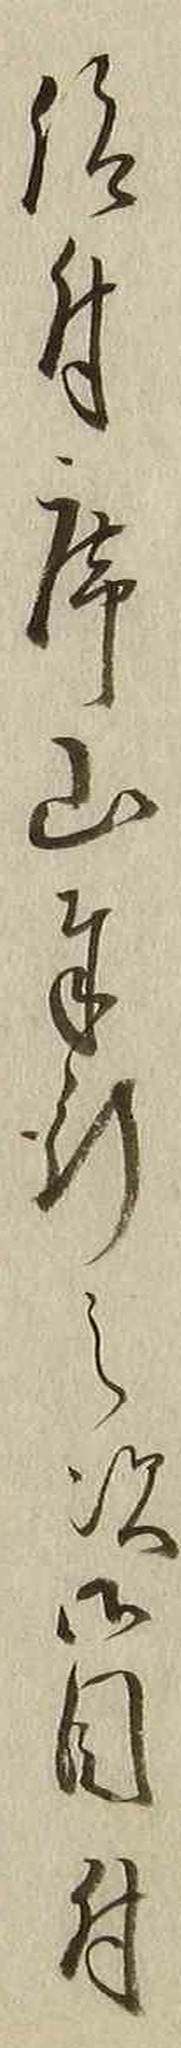仰付席山奉行之次御目付
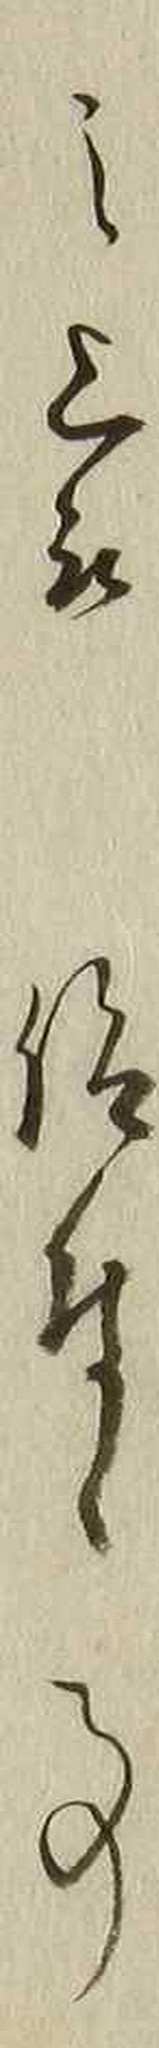之上被仰付候事
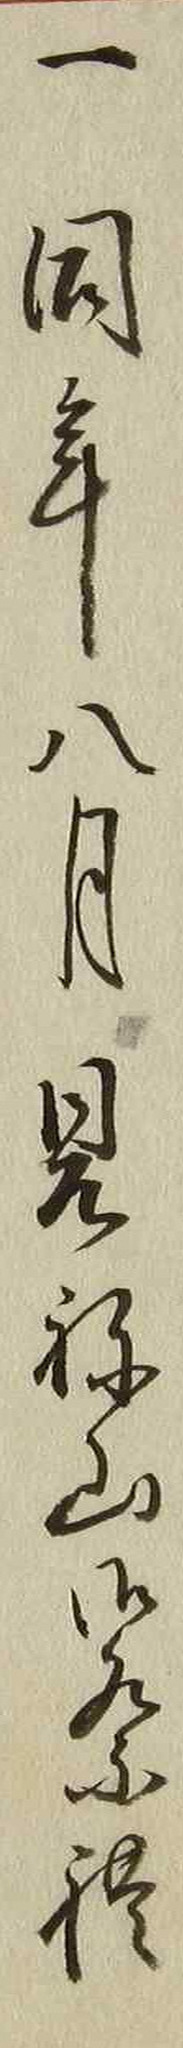一同年八月見祢山御祭礼
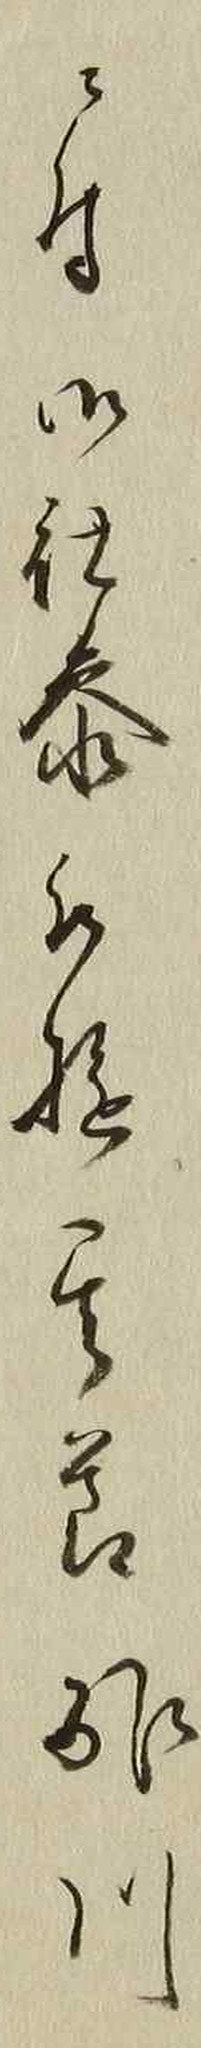ニ付御社泰被遊其節酢川
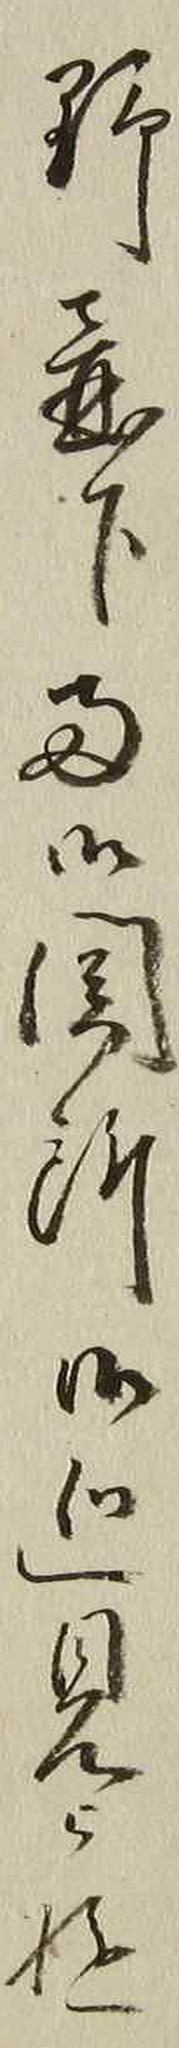之壺下両御関所御巡見被遊
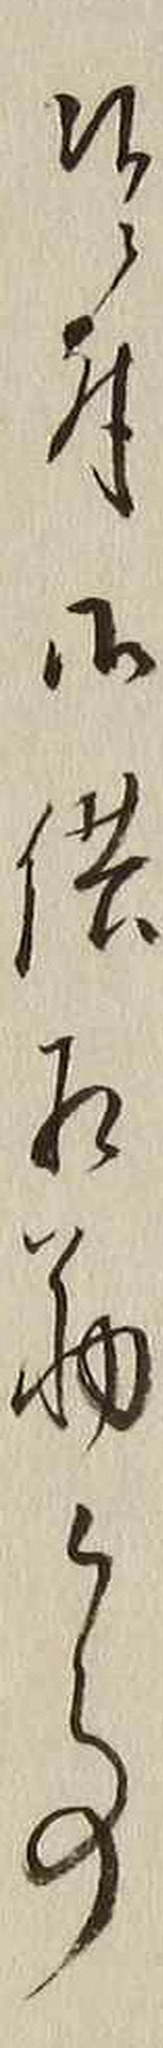候ニ付御供相勤候事
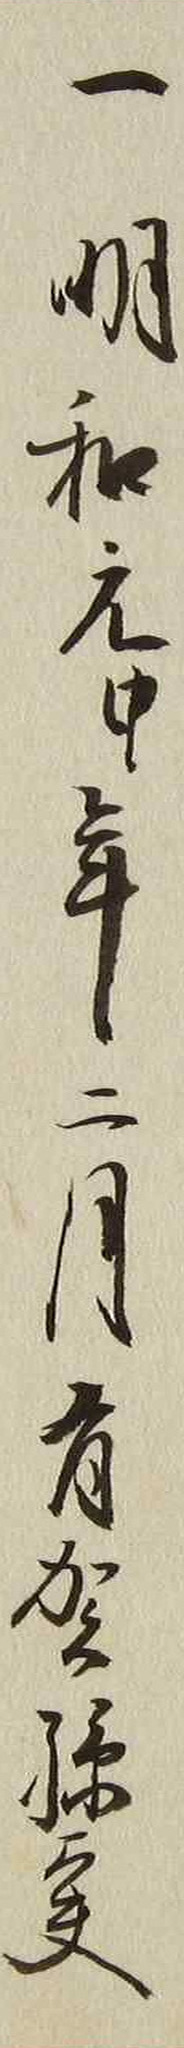一明和元申年二月有賀孫大夫
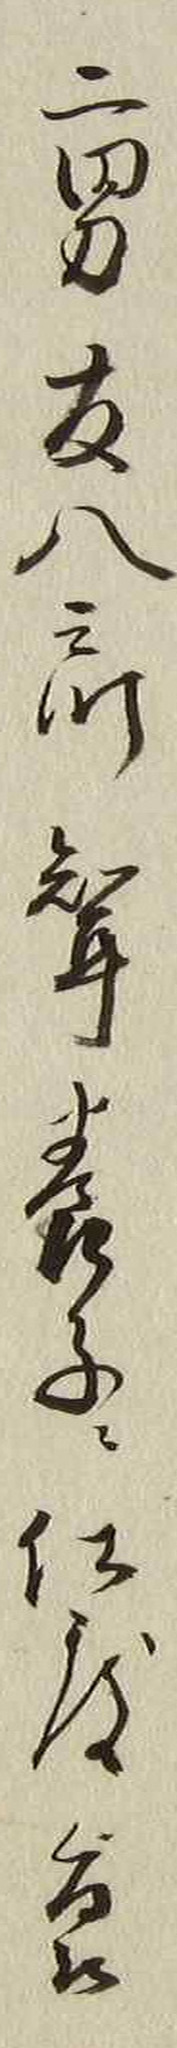二男友八郎聟養子ニ仕度旨被
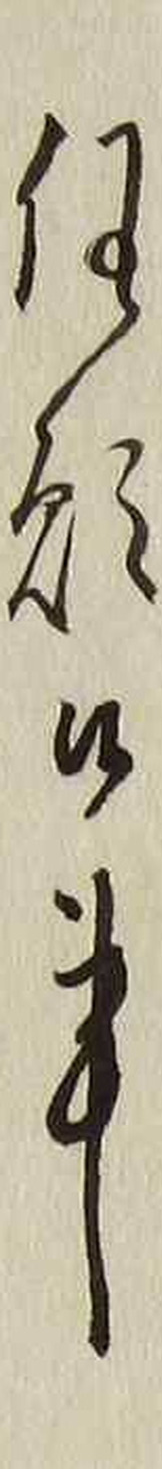任願候事
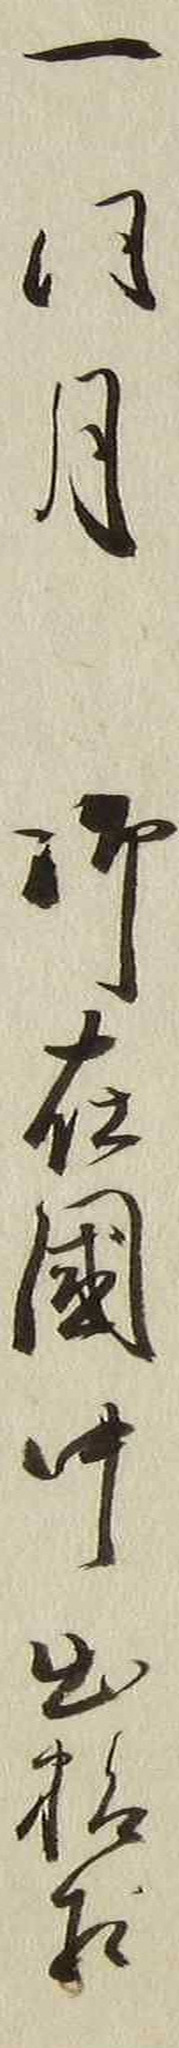一同月御在国中出精相
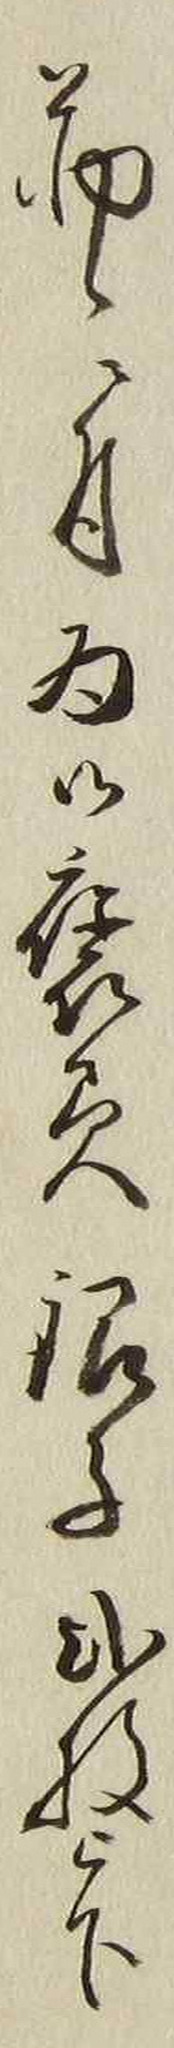勤候ニ付為御褒美銀子弐枚被下
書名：諸士系譜　巻之18　い之部18
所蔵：会津若松市立会津図書館
